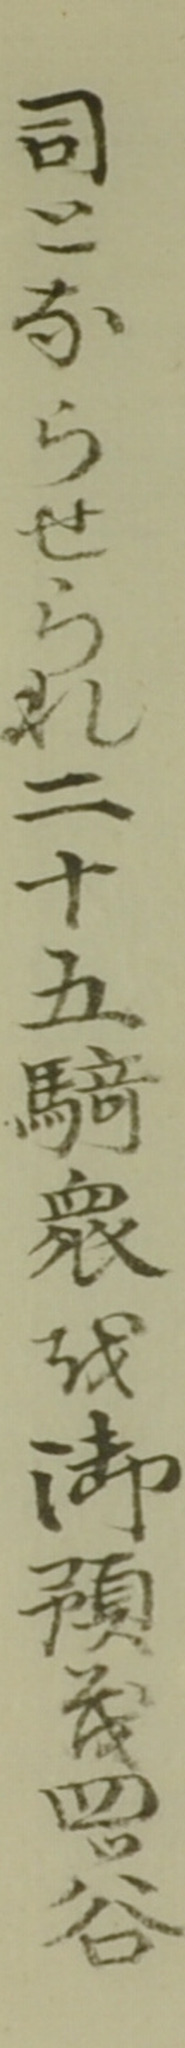司とならせられ二十五騎衆を御預も四つ谷
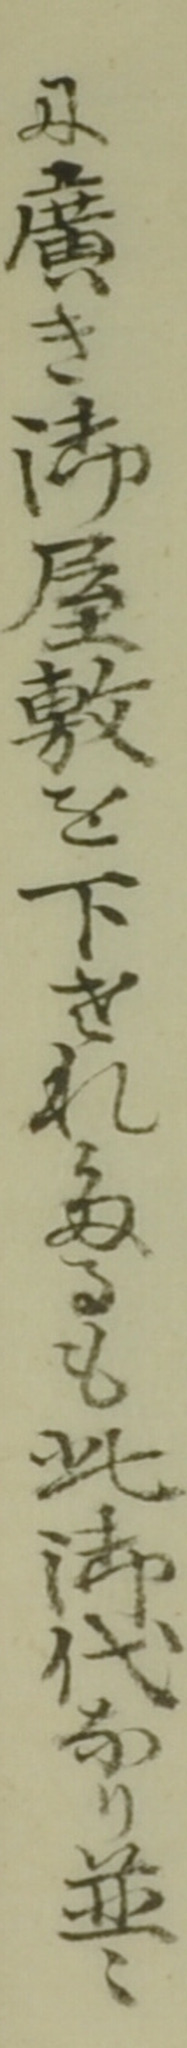に広き御屋敷を下されたるも此御代なり並々
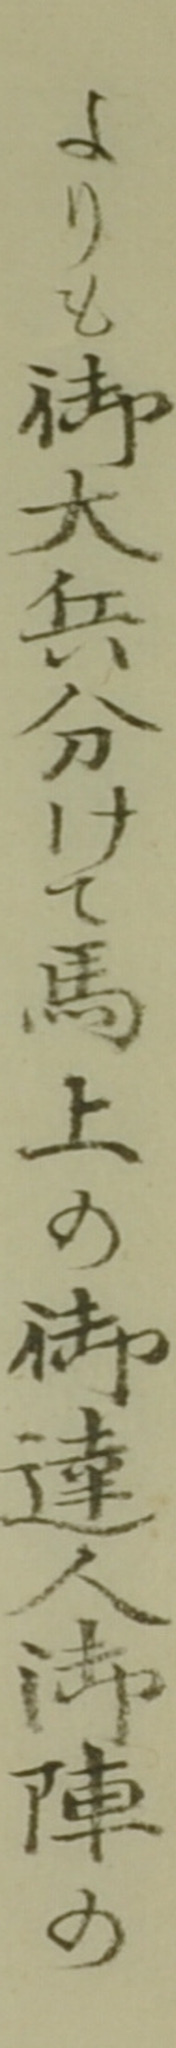よりも御大兵分けて馬上の御達人御陣の
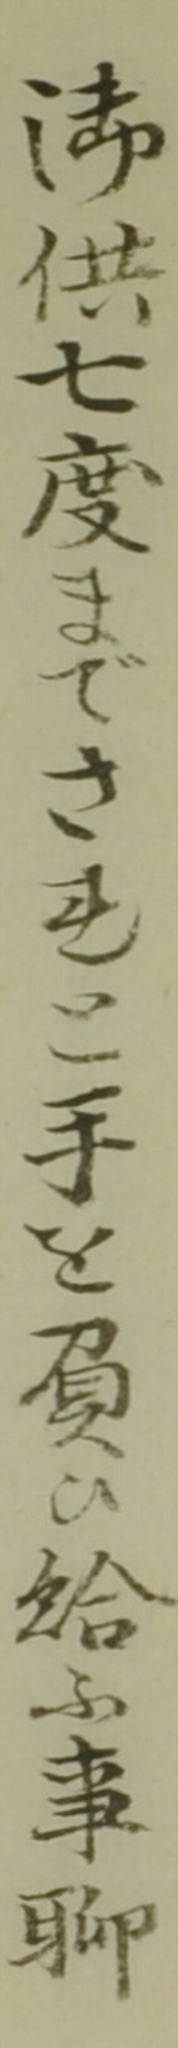御供七度までされと手を負ひ給ふ事聊
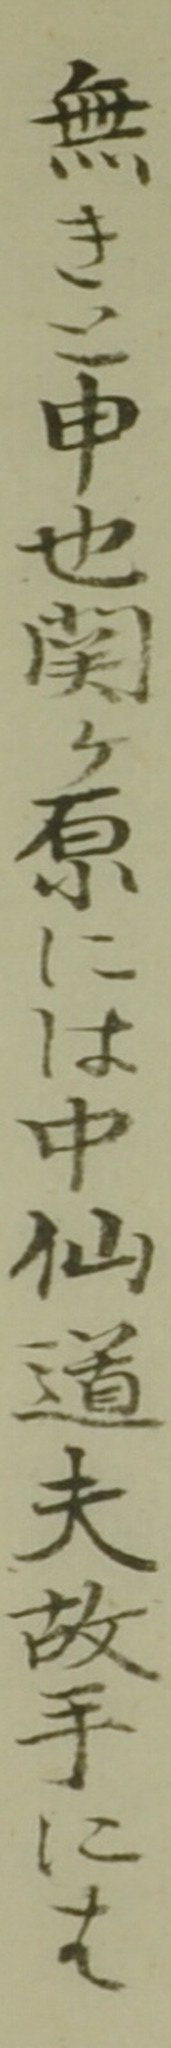無きと申也関ケ原には中仙道夫故手には
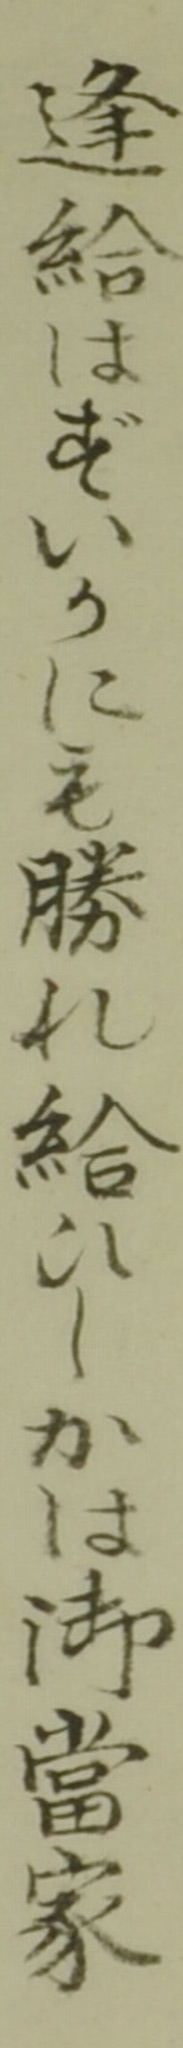逢給はずいかにも勝れ給ひしかは御当家
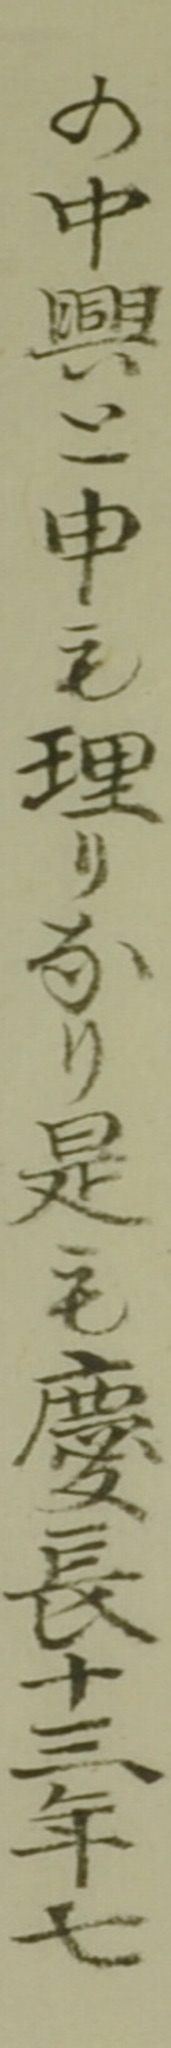の中興と申も理りなり是も慶長十三年七
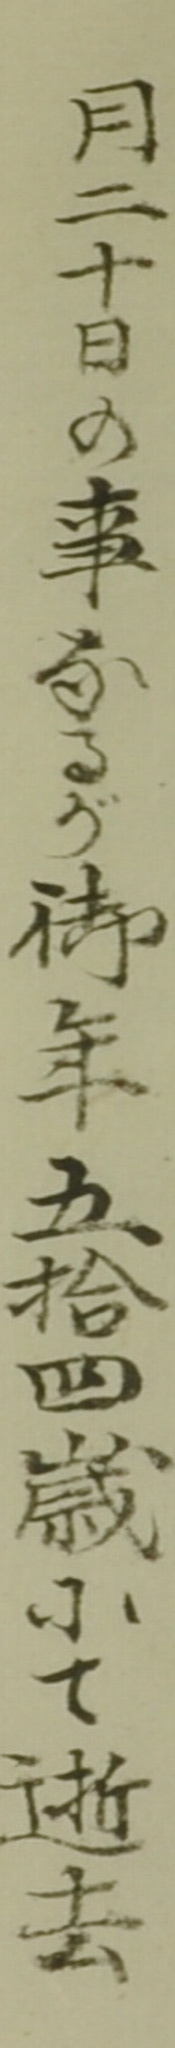月二十日の事なるが御年五拾四歳にて逝去

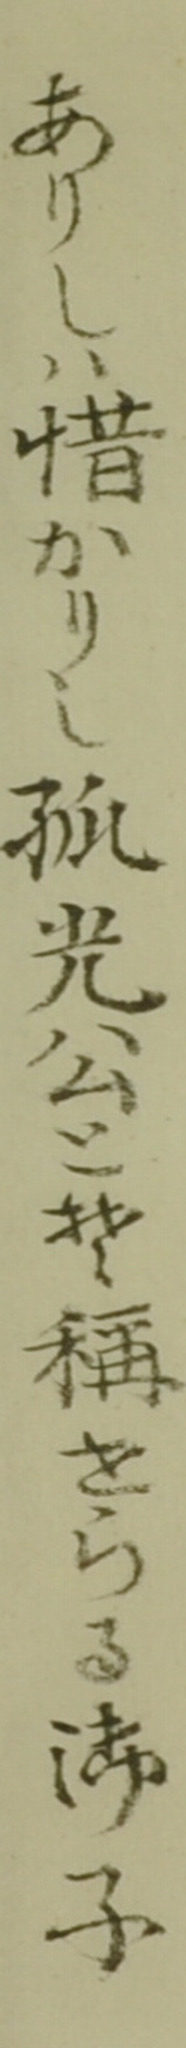ありしは惜かりし孤光公とそ称せらる御子
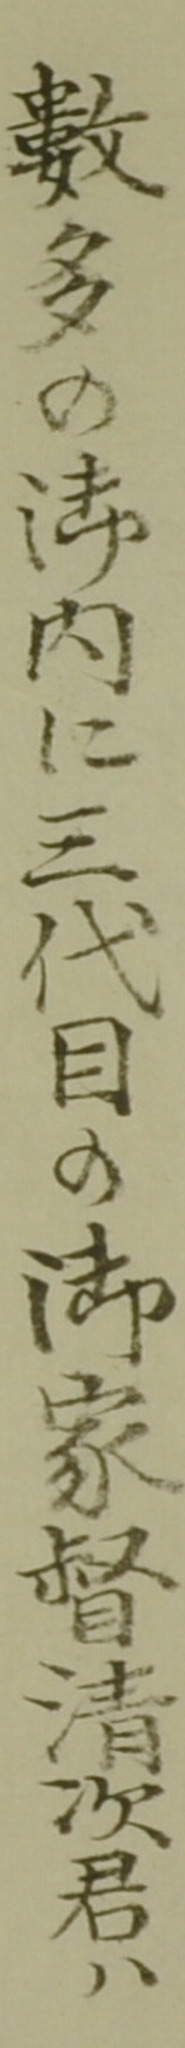数多の御内に三代目の御家督清次君は
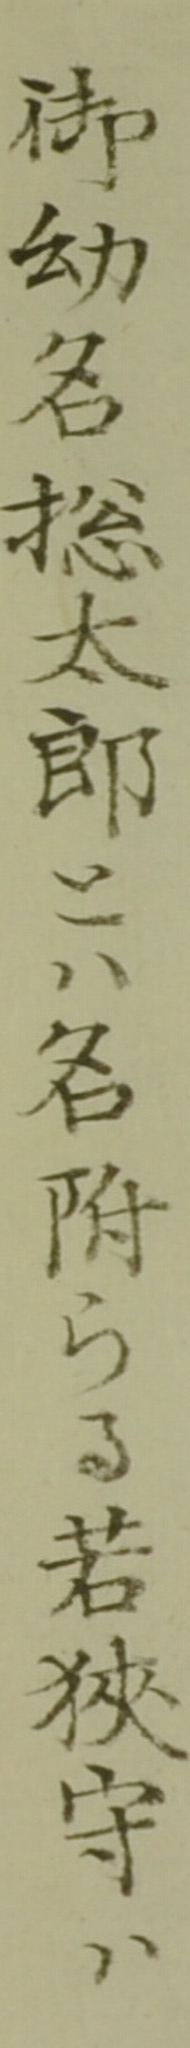御幼名総太郎とは名附らる若狭守は
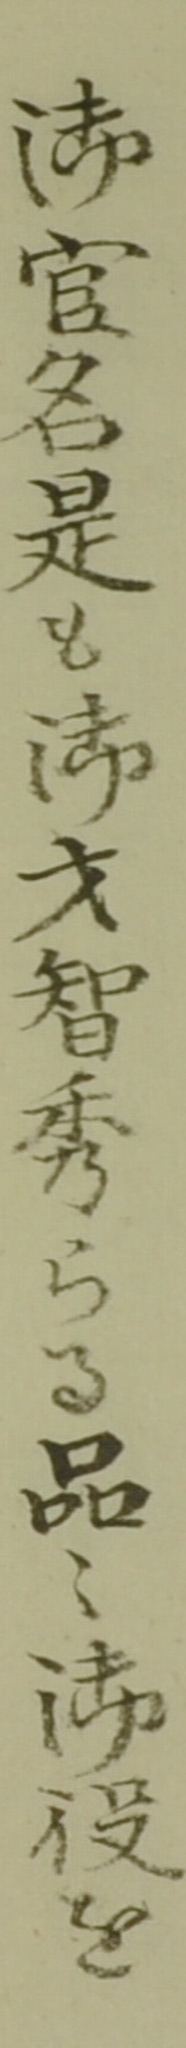御官名是も御才智秀らる品々御役を
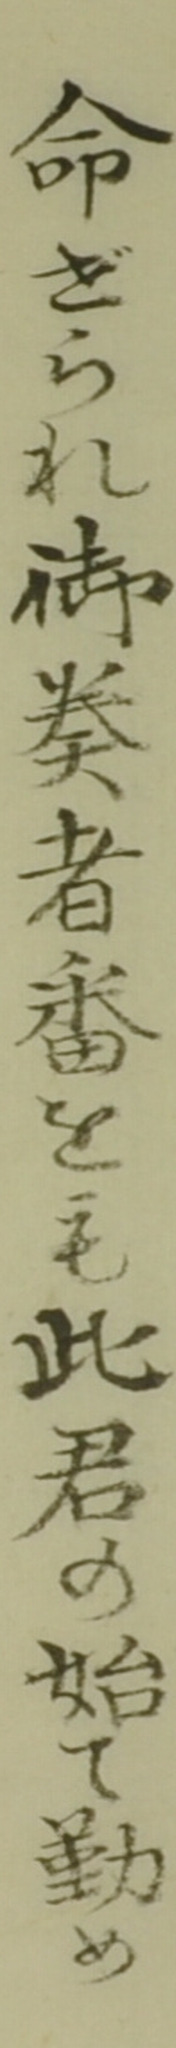命ぜられ御奏者番をも此君の始て勤め
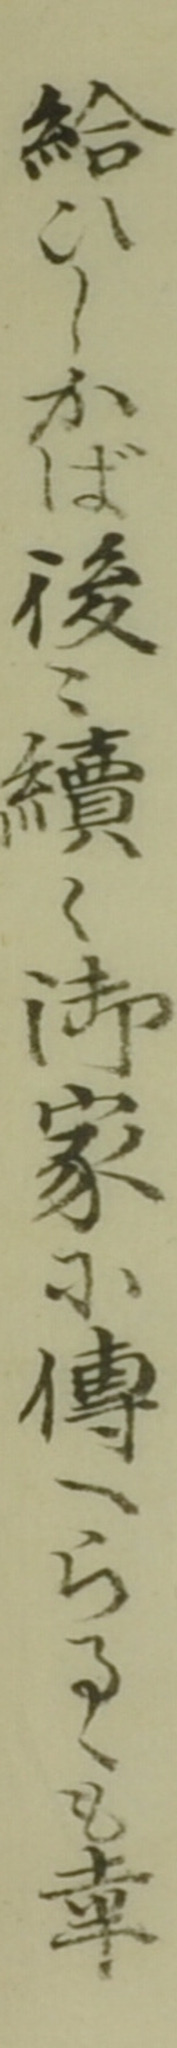給ひしかば後々続く御家に傳へらるゝも幸
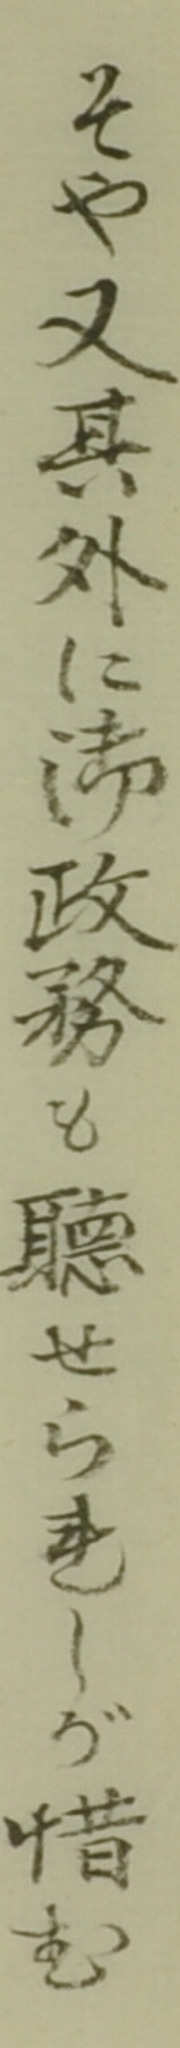そや又其外に御政務も聴せられしが惜む
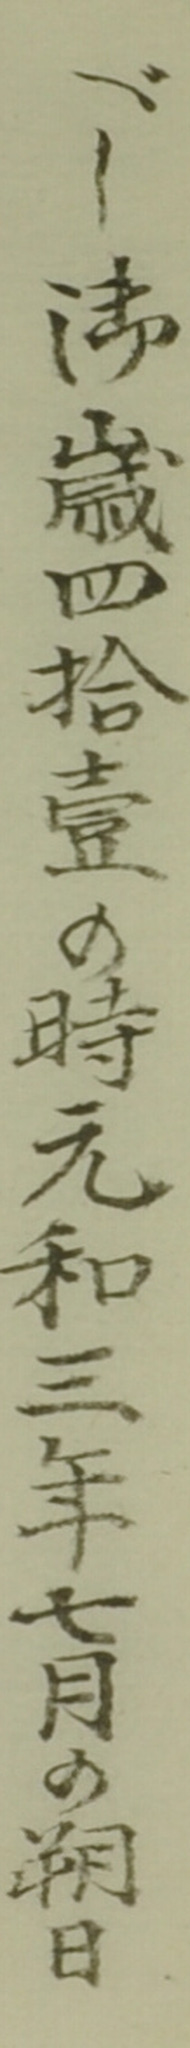べし御歳四拾壱の時元和三年七月の朔日
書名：藤葛（全）
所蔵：伊那市立高遠町図書館・合同会社AMANE
